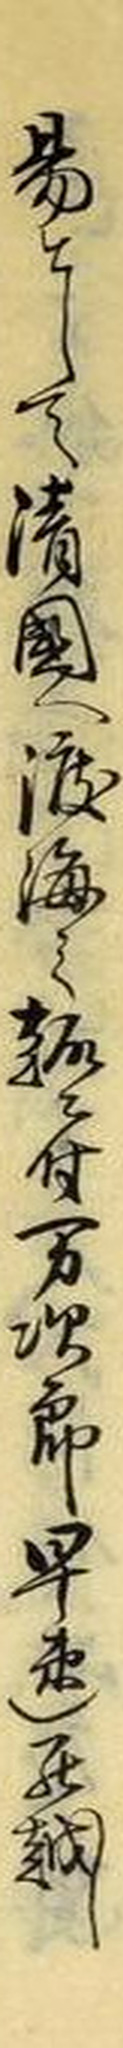易として清国へ渡海の趣ニ付万次郎早速罷越し
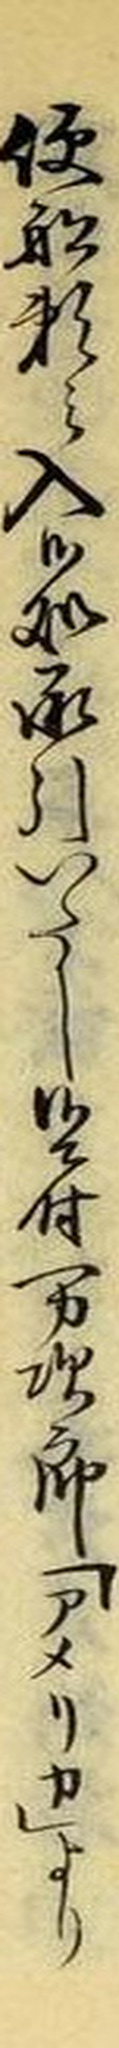便船頼ミ入候処承引いたし候二付万次郎「アメリカ」より
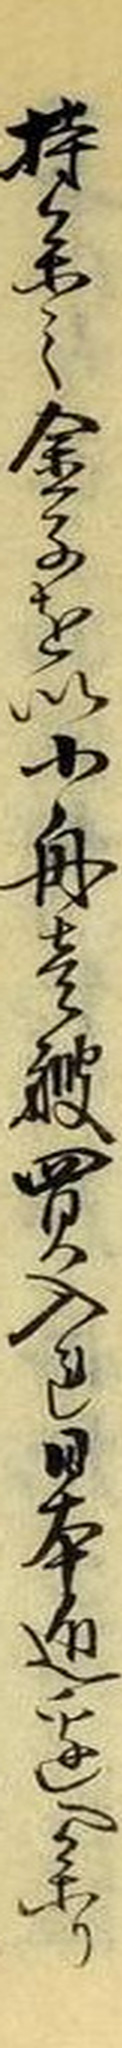持参之金子を以小舟一艘買入れ日本近辺へ参り
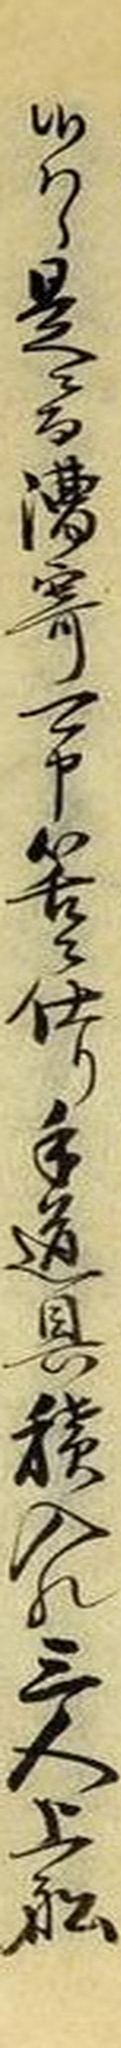候ハヽ是ニ而漕寄可申筈ニ付り手道具積入れ三人上船
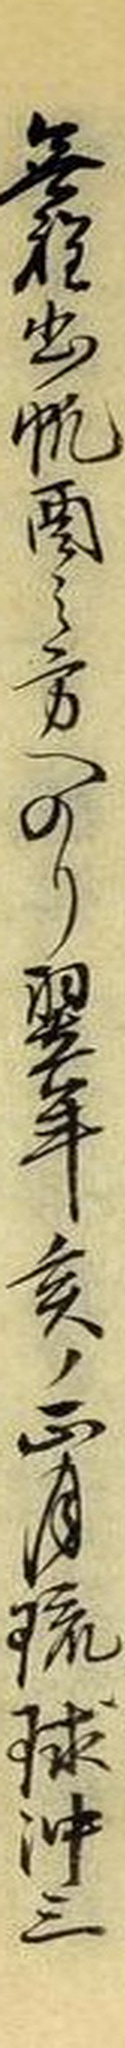無程出帆酉之方へのり翌年亥ノ正月琉球沖三
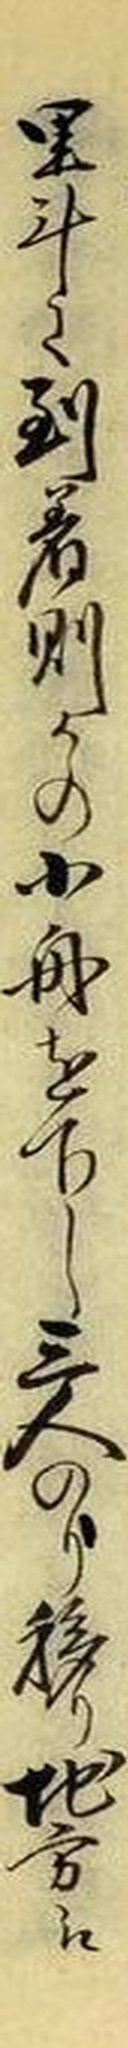里計に到着則かの小舟を下し三人のり移り地方江
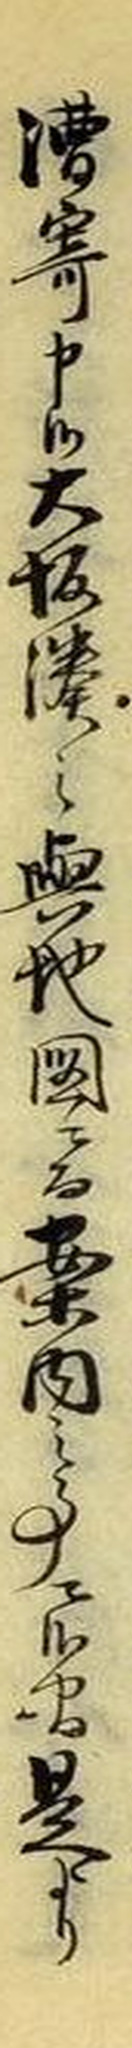漕寄申候大坂湊之欤地図ニ而案内之事ニ候間是より
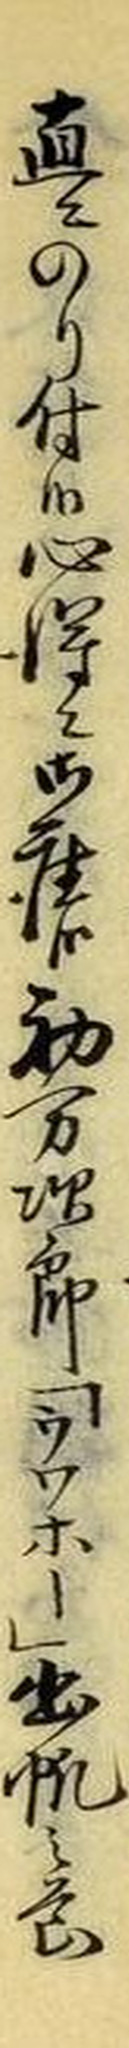直ニのり付候心得ニ御座候初万次郎「ウワホー」出帆之節
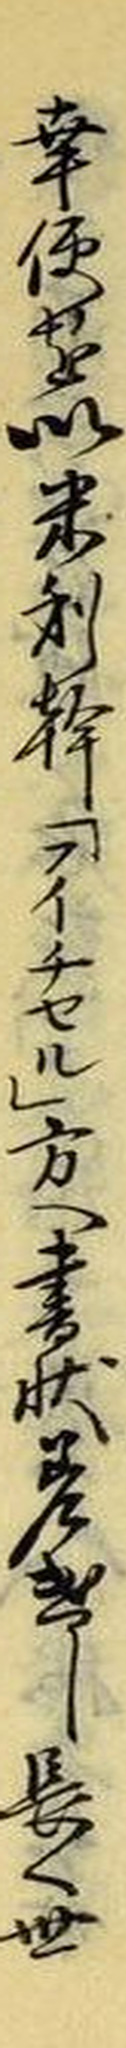葉便を以米利幹「フイチセル」方へ書状差遣し長く背世
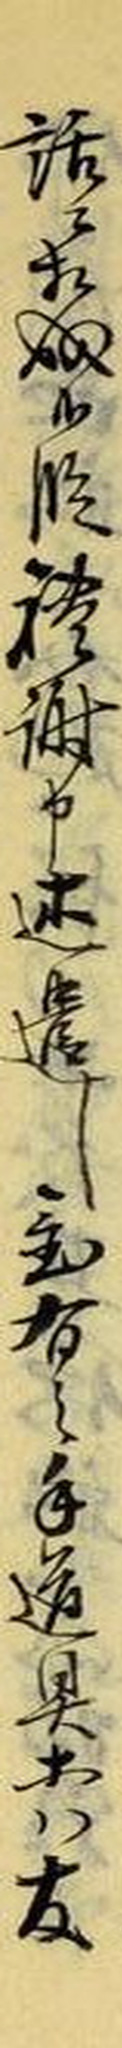話ニ相成候段礼謝申述遣し置有之手道具等ハ友
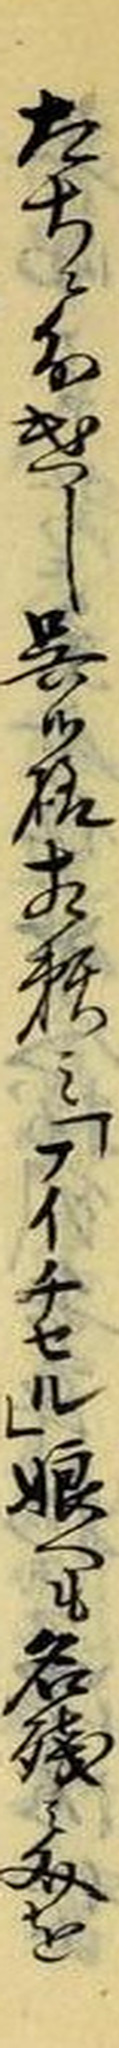たちニ分遣し呉候様相頼ミ「フイチセル」娘へも名残之文を
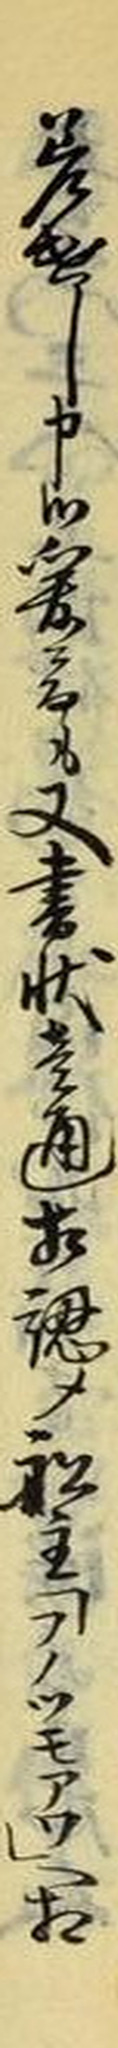差遣し申候爰ニ而も又書状一通相認メ船主「フノツモアワ」へ相
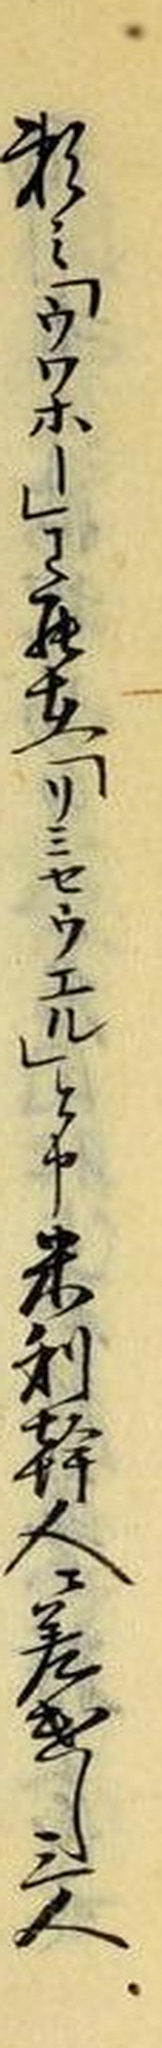頼ミ「ウワホー」に罷在「リミセウエル」と申米利幹人ニ差遣し三人
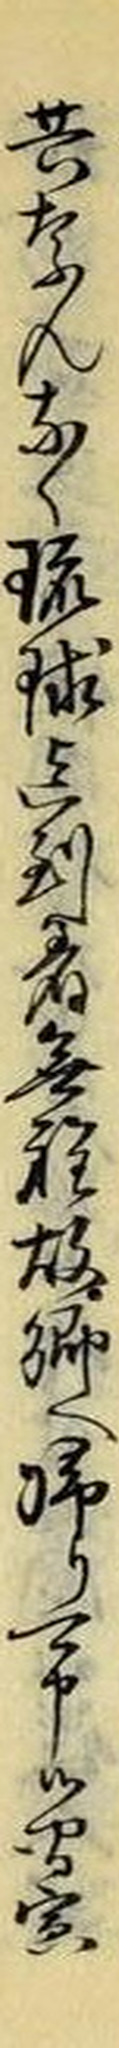共なんなく琉球迄到着無程故郷へ帰り可申候間寅
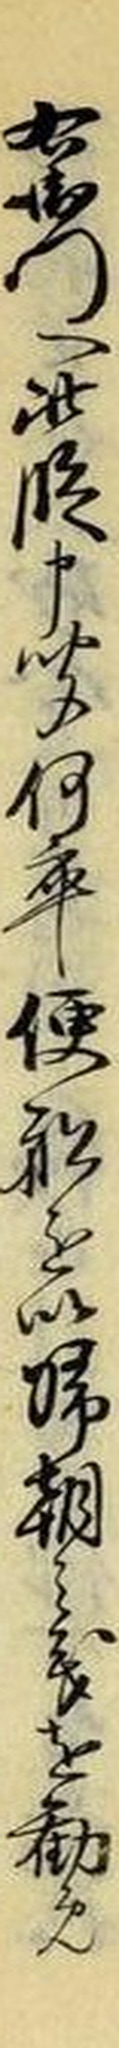右衛門へ此段申聞何卒便船を以帰朝之義を勧め
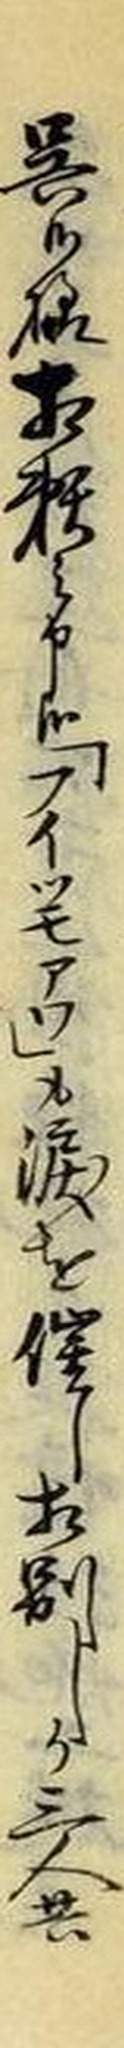呉候様相頼ミ申候「フイツモアワ」も涙を催し相別相別トケ三人共
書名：漂客談奇（備考雑録写8）
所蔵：福井県文書館 Fukui Prefectural Archives
